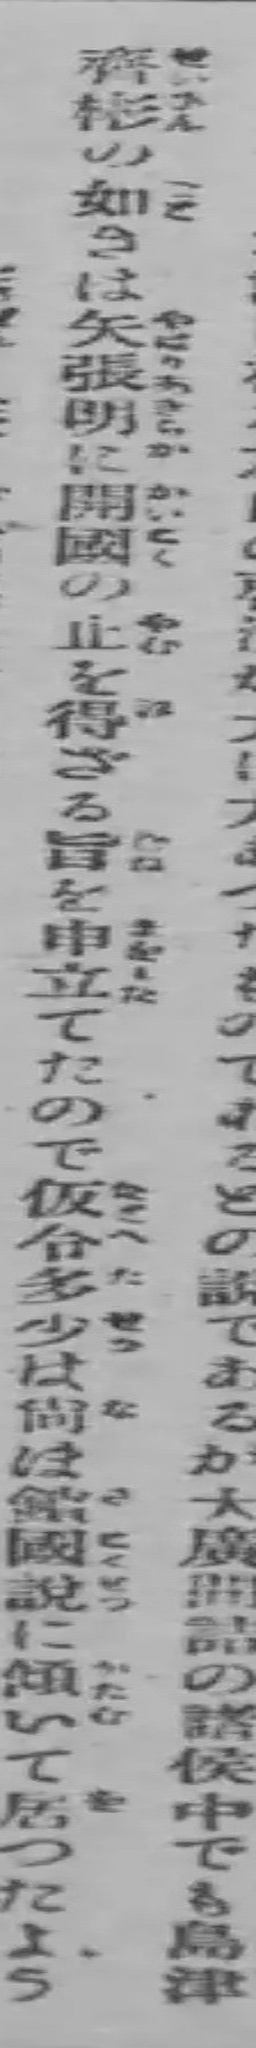斉彬の如きは矢張明に開国の止を得ざる旨を申立てたので仮令多少は尚ほ鎖国説に傾いて居つたよう
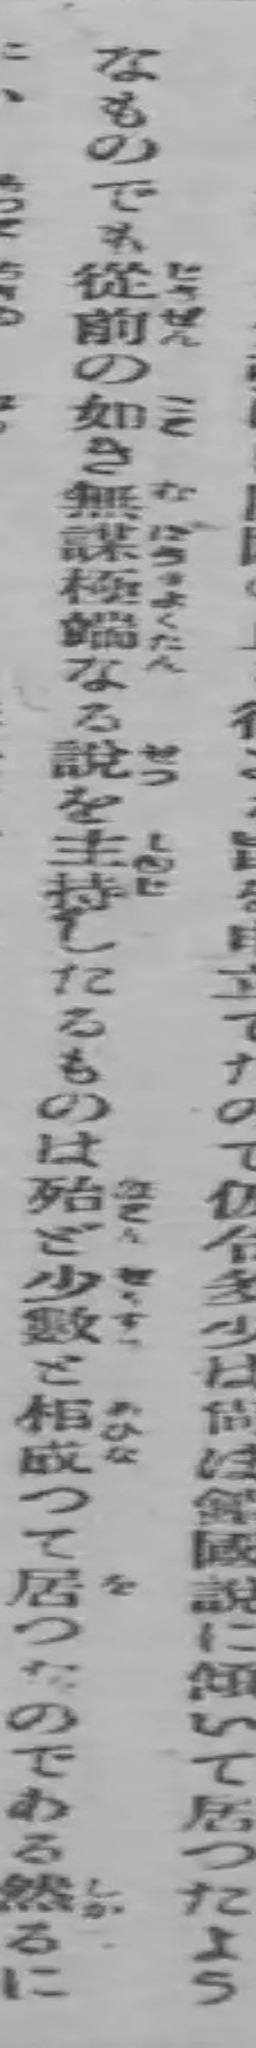なものでも従前の如き無謀極端なる説を主持したるものは殆ど少数と相成つて居つたのである然るに
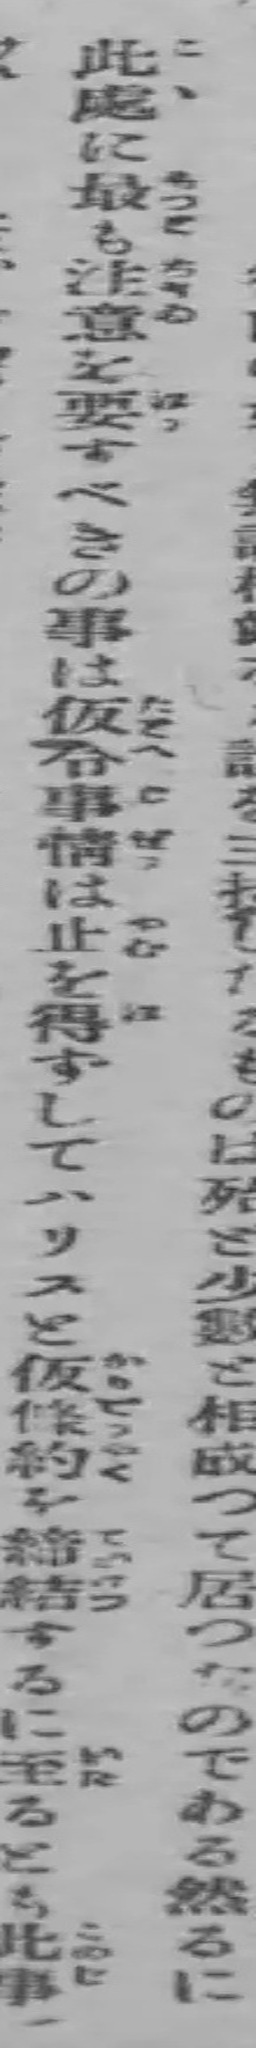此処に最も注意を要すべきの事は仮令事情は止を得ずしてハリスと仮条約を締結するに至るとも此事
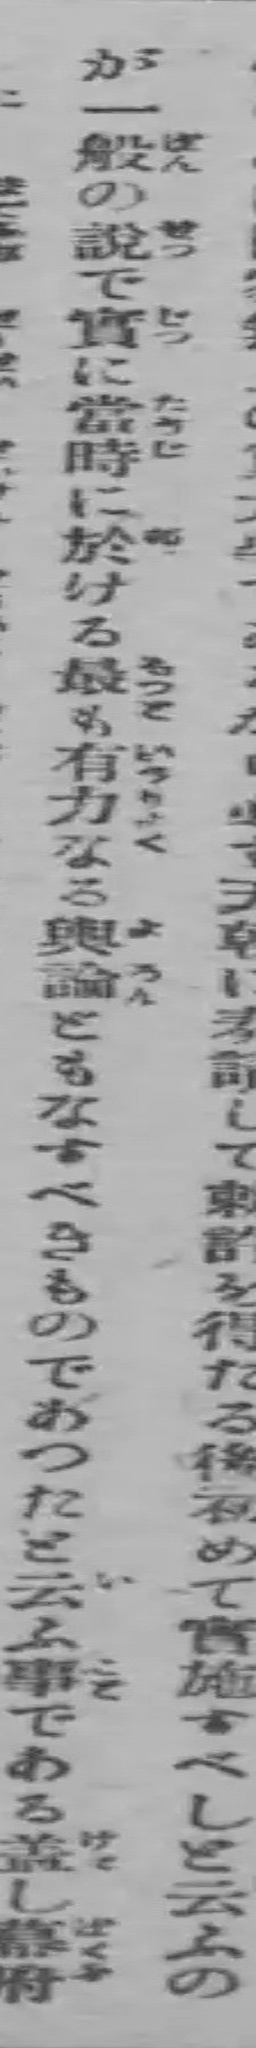が一般の説で実に当時に於ける最も有力なる輿論ともなすべきものであつたと云ふ事である蓋し幕府
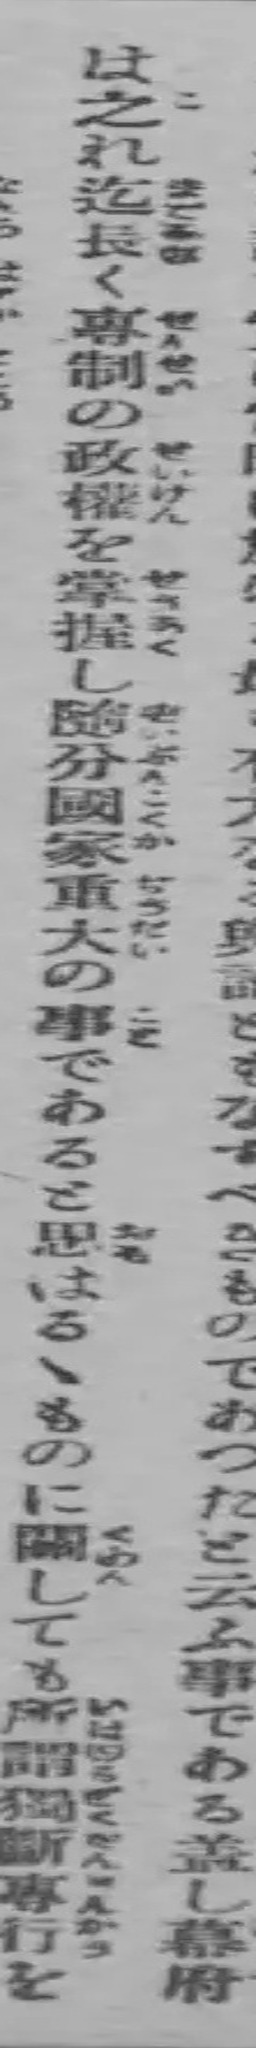は之れ迄長く専制の政権を掌握し随分国家重大の事であると思はるゝものに関しても所謂独断専行を
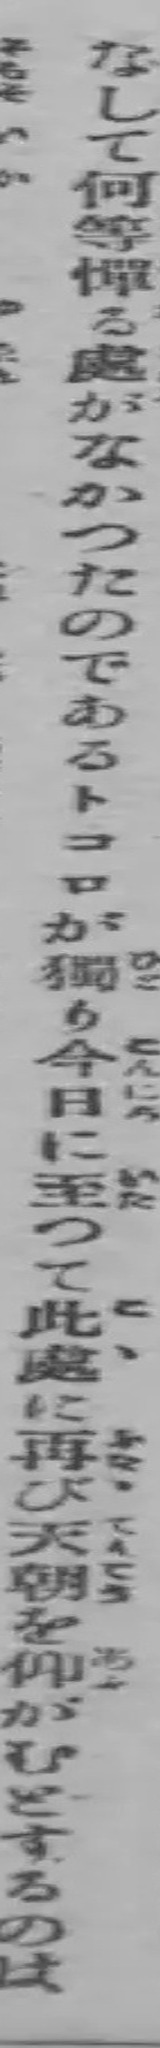なして何等憚る処がなかつたのであるトコロが独り今日に至つて此処に再び天朝を仰がむとするのは
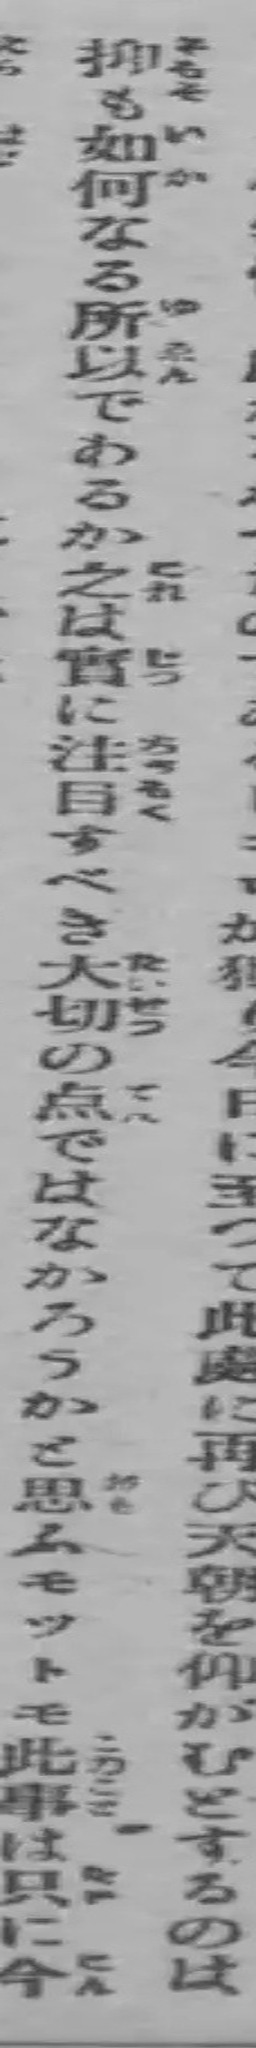抑も如何なる所以であるか之は実に注目すべき大切の点ではなかろうかと思ふモツトモ此事は只に今
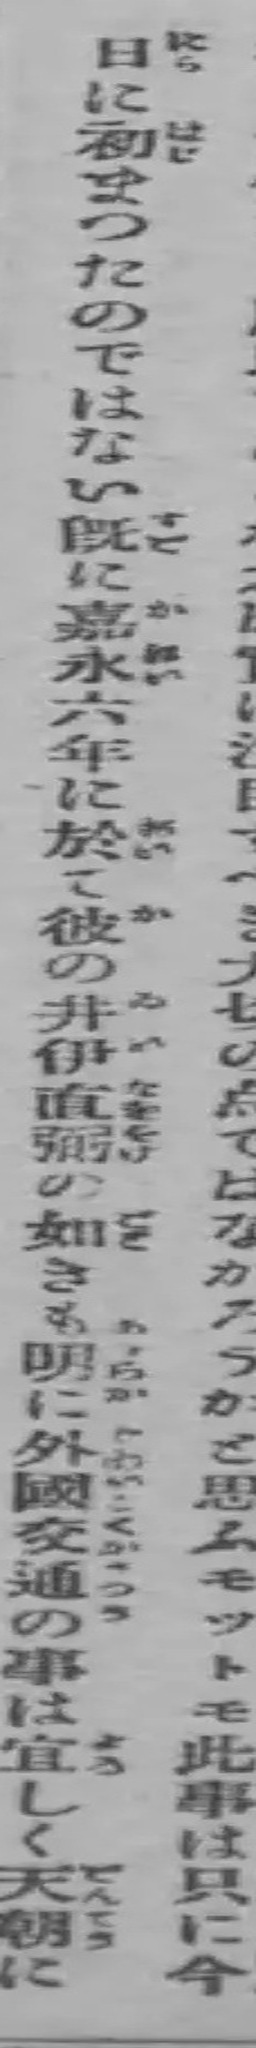日に初まつたのではない既に嘉永六年に於て彼の井伊直弼の如きも明に外国交通の事は宜しく天朝に
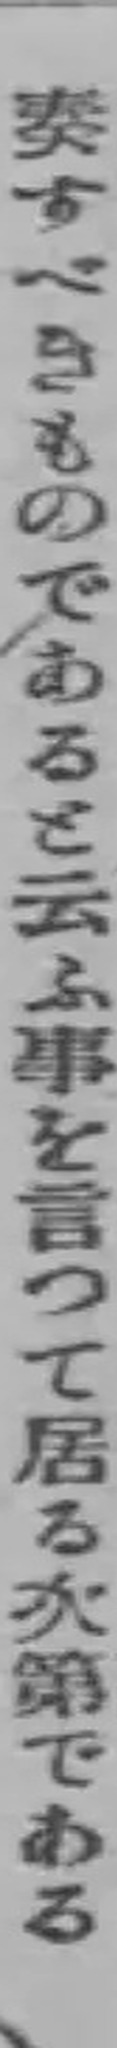奏すべきものであると云ふ事を言つて居る次第である
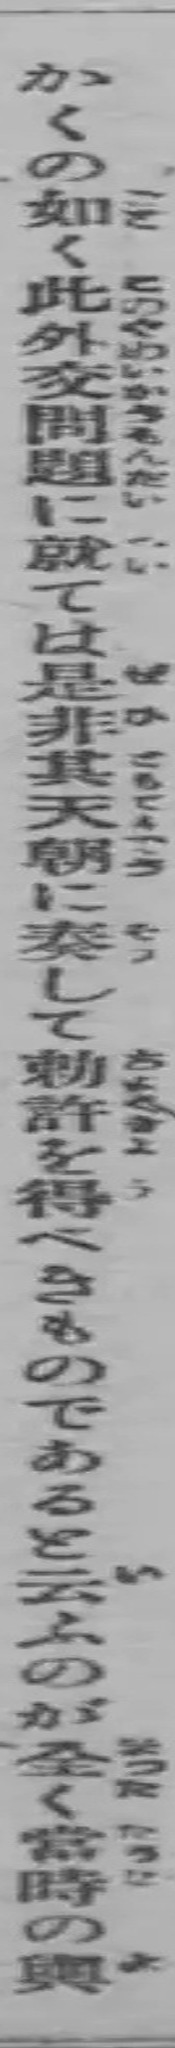かくの如く此外交問題に就ては是非共天朝に奏して勅許を得べきものであると云ふのが全く当時の輿
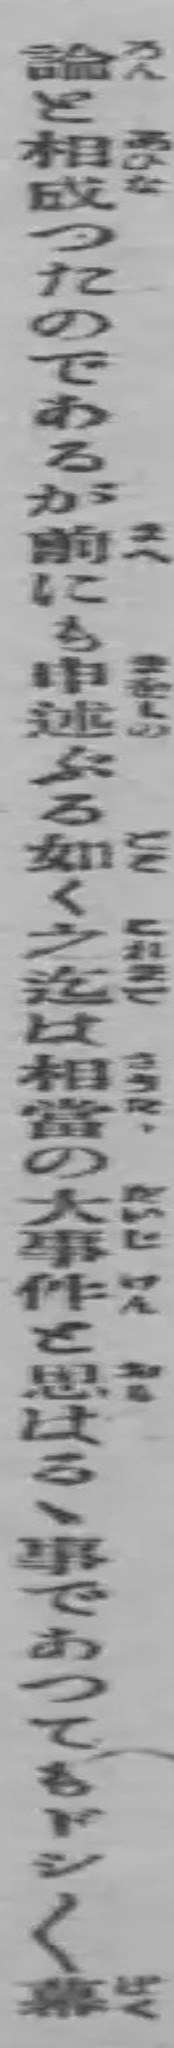論と相成つたのであるが前にも申述ぶる如く之迄は相当の大事件と思はるゝ事であつてもドシ〳〵幕
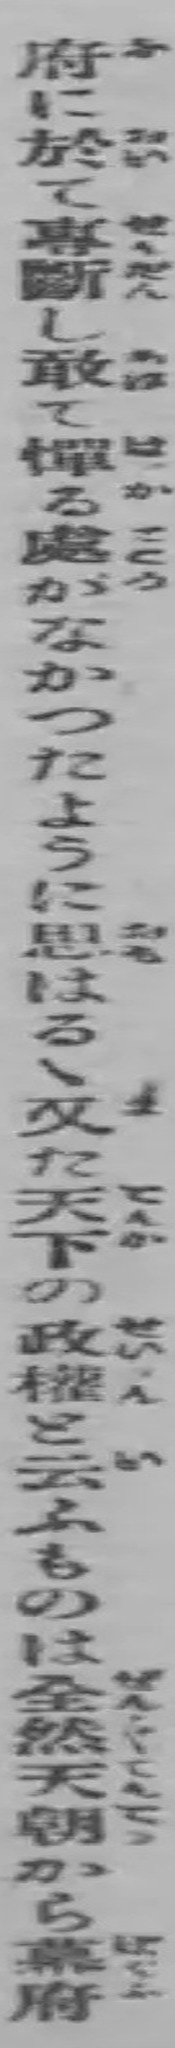府に於て専断し敢て憚る処がなかつたように思はるゝ又た天下の政権と云ふものは全然天朝から幕府
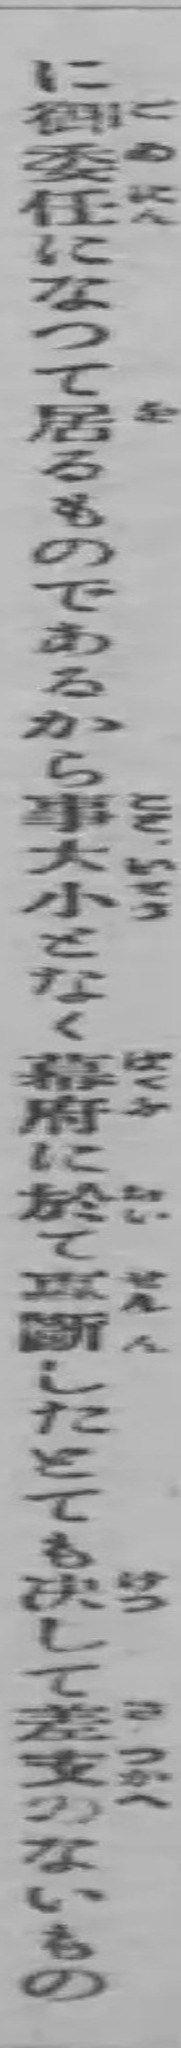に御委任になつて居るものであるから事大小となく幕府に於て専断したとても決して差支のないもの
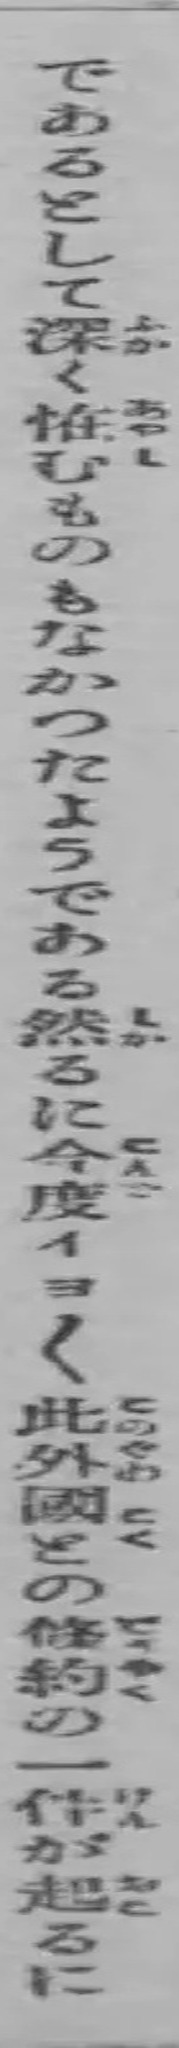であるとして深く恠むものはなかつたようである然るに今度イヨ〳〵此外国との条約の一件が起るに
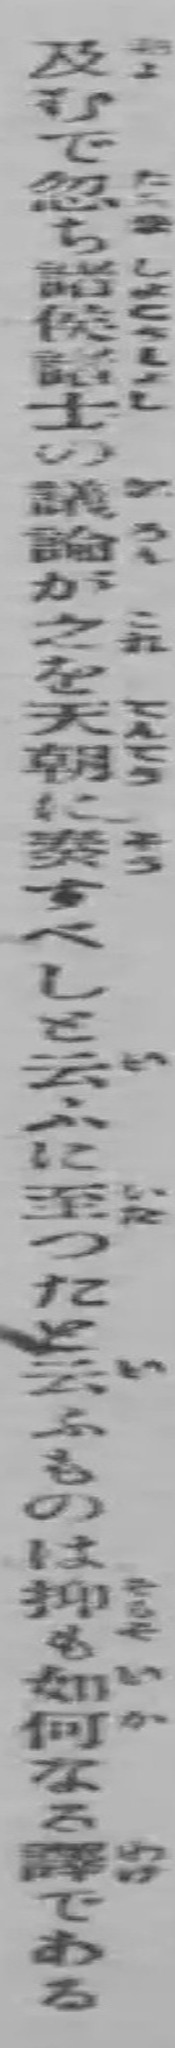及むで忽ち諸侯諸士の議論が之を天朝に奏すべしと云ふに至つたと云ふものは抑も如何なる訳である
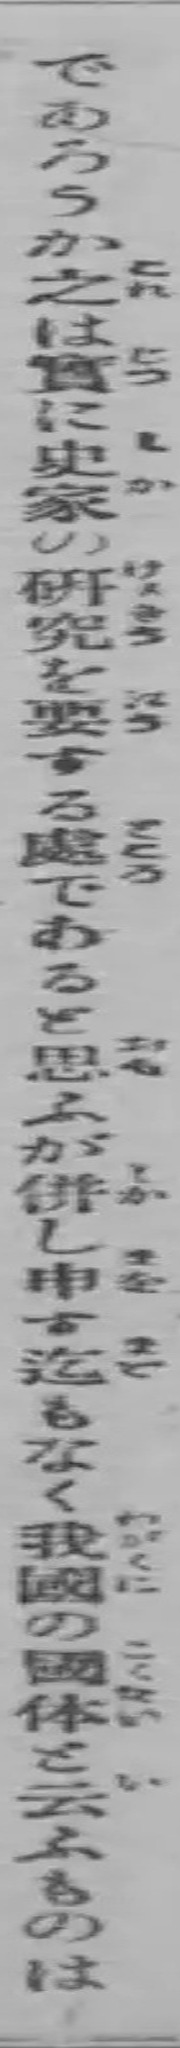であろうか之は実に史家の研究を要する処であると思ふが併し申す迄もなく我国の国体と云ふものは
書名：豊橋市史談
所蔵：国立国会図書館 National Diet Library, JAPAN
